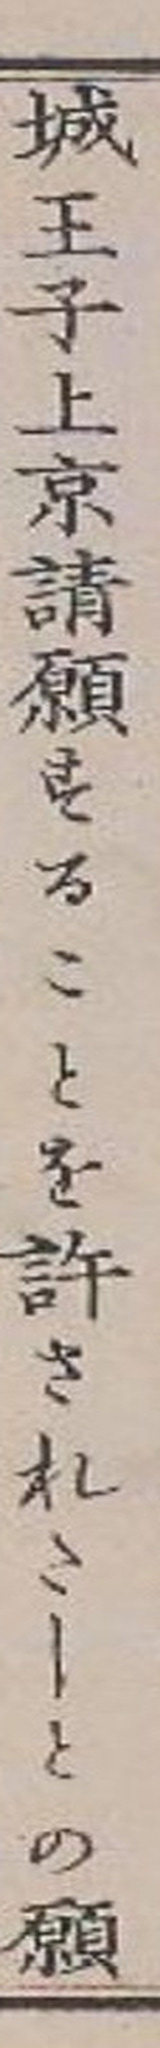城王子上京請願することを許されたしとの願
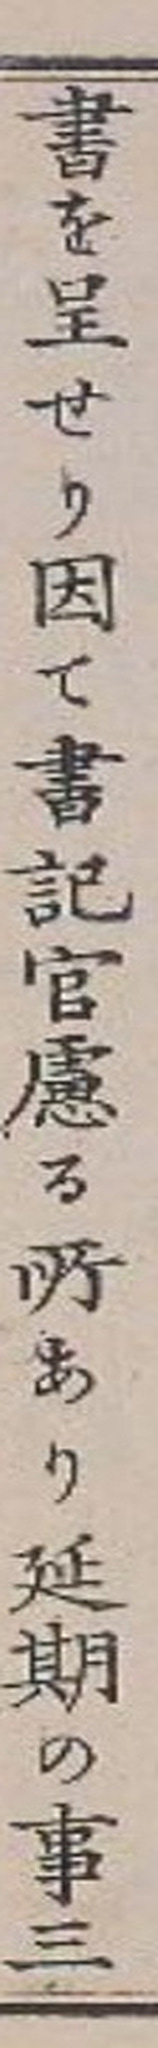書を呈せり因て書記官慮る所あり延期の事三
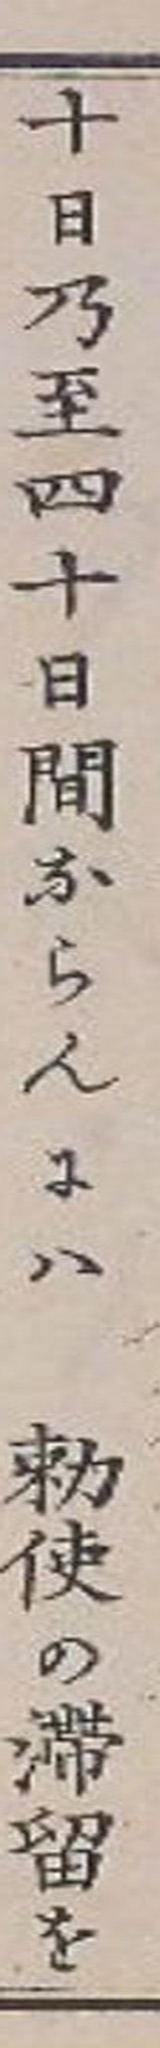十日乃至四十日間ならんには勅使の滞留を
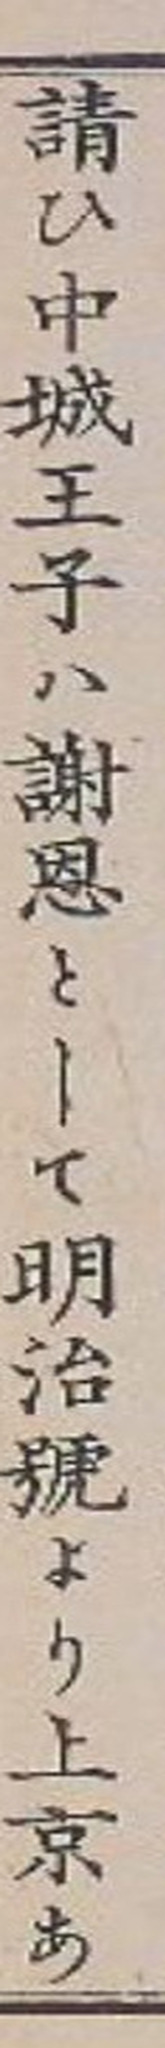請ひ中城王子は謝恩として明治号より上京あ
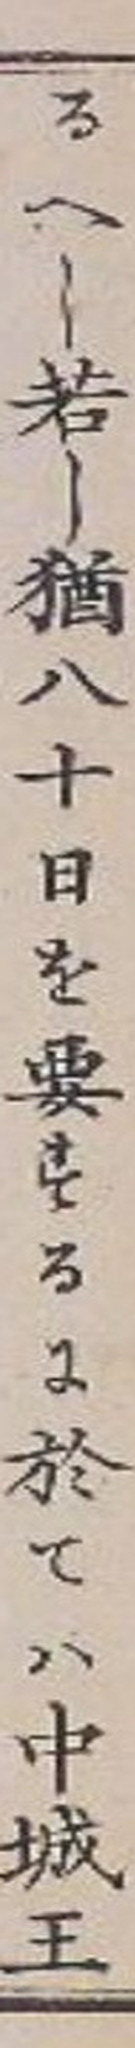るへし若し猶八十日を要するに於ては中城王
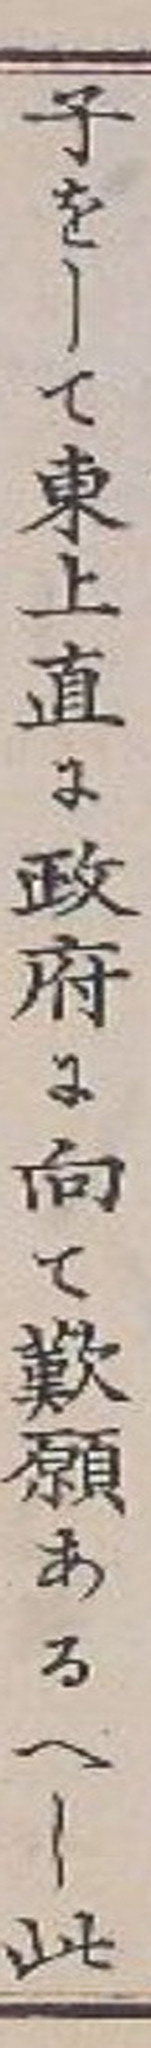子をして東上直に政府に向て歎願あるへし此
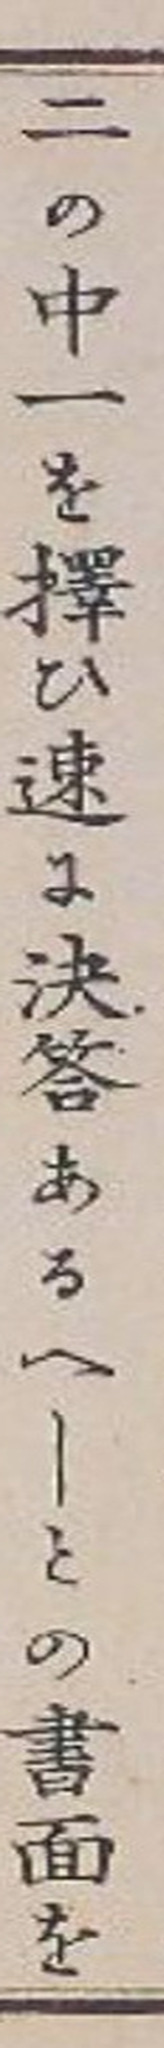二の中一を択ひ速に決答あるへしとの書面を
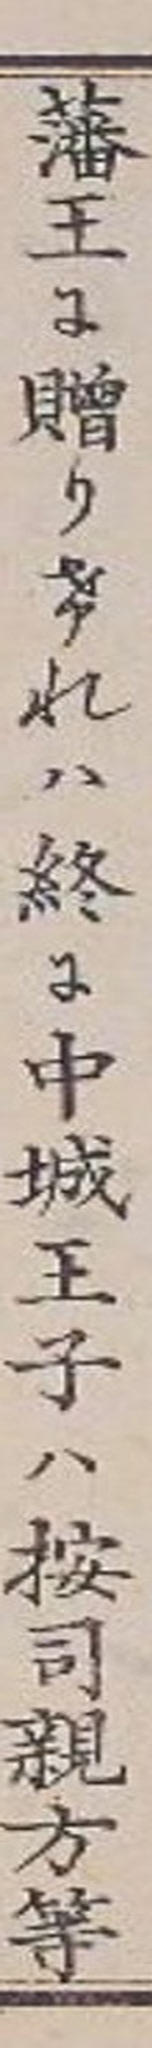藩王に贈りけれは終に中城王子は按司親方等
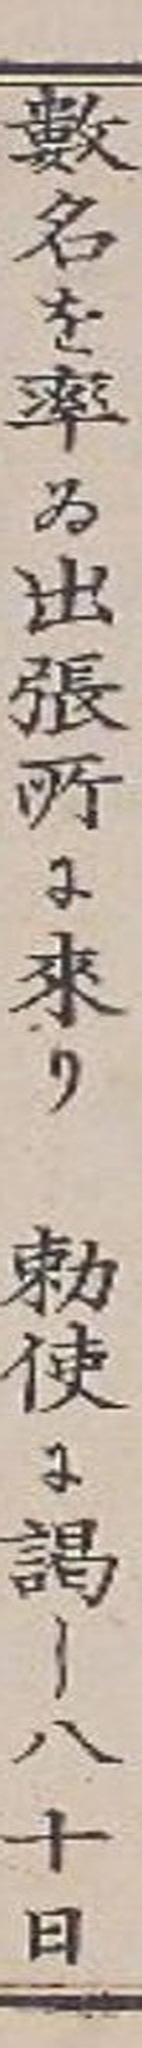数名を率ゐ出張所に来り勅使に謁し八十日
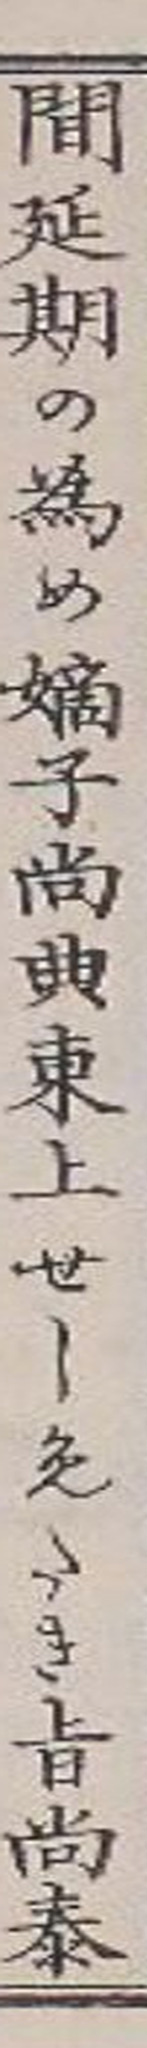間延期の為め嫡子尚典東上せしめたき旨尚泰
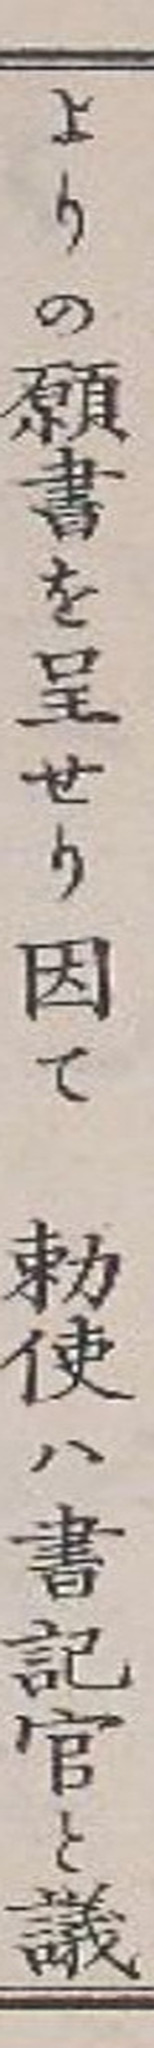よりの願書を呈せり因て勅使は書記官と議
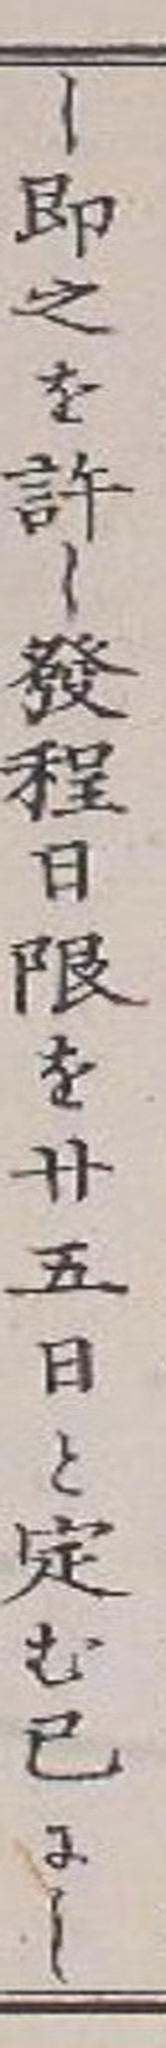し即之を許し発程日限を廿五日と定む已にし
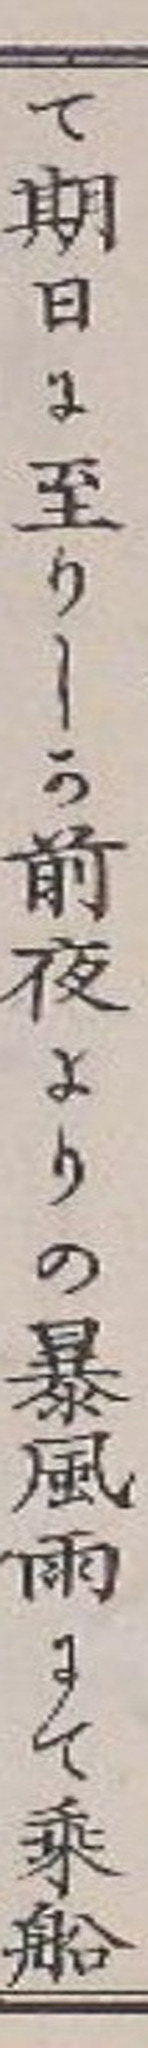て期日に至りしか前夜よりの暴風雨にて乗船
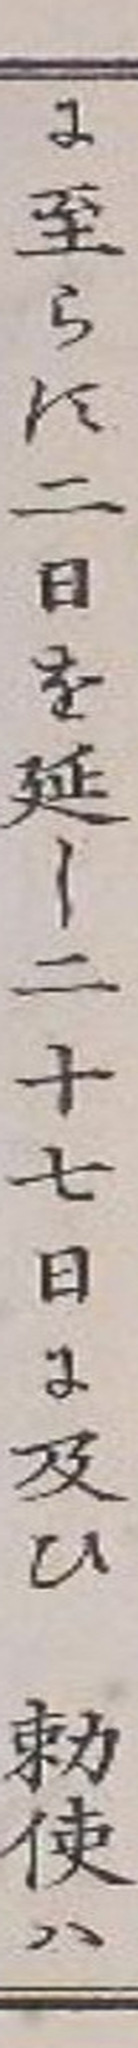に至らす二日を延し二十七日に及ひ勅使は
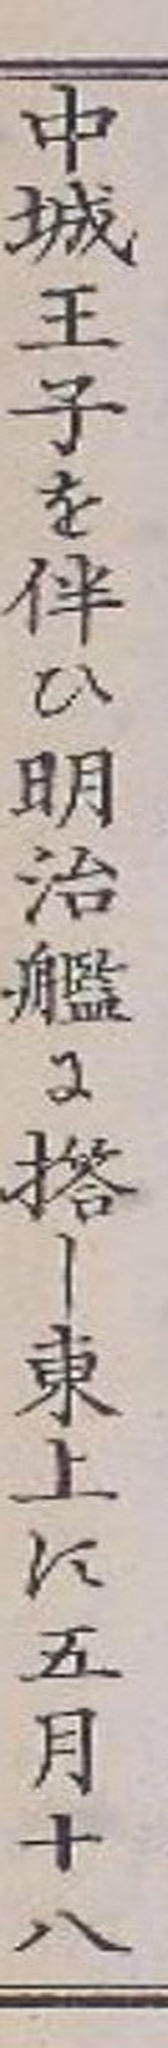中城王子を伴い明治艦に搭し東上す五月十八
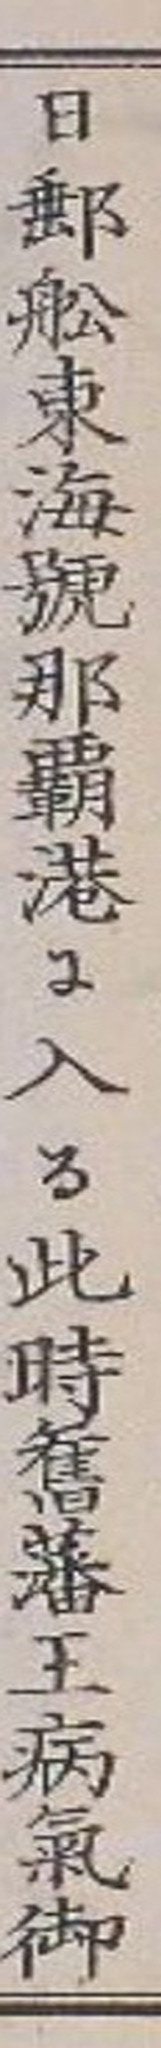日郵船東海号那覇港に入る此時旧藩王病気御
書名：南島紀事 下
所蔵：University of the Ryukyus Library
